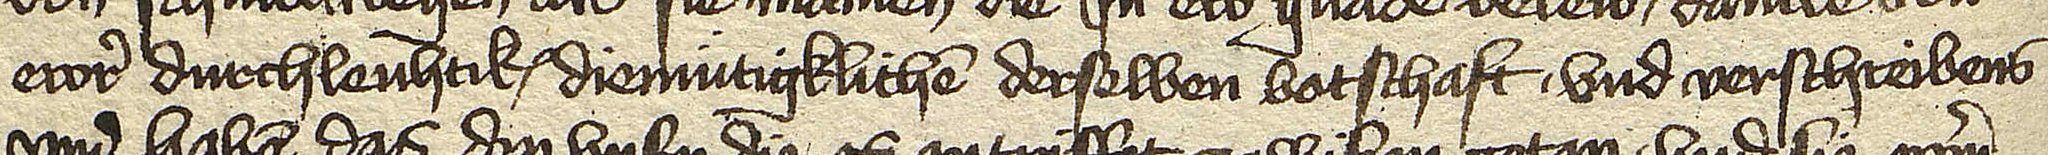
ewr* durchleuhtik* / diemütigkliche* derſelben botſchaft / vnd verſchreibens
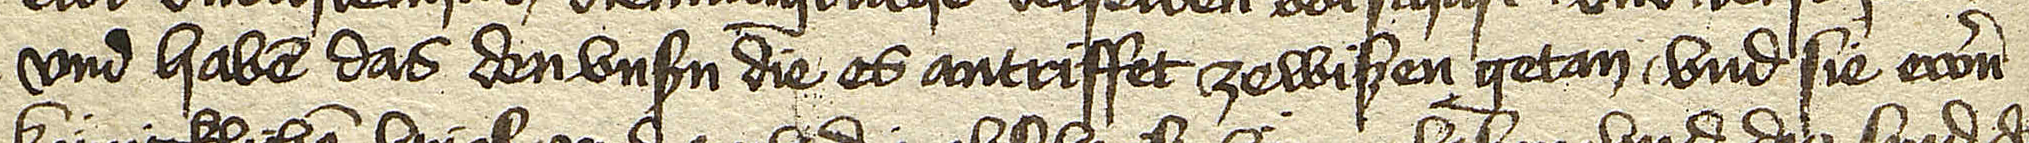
vnd habe* das den vnſ*n die es antriffet cʒewiſʒen getan / vnd ſie ewn*
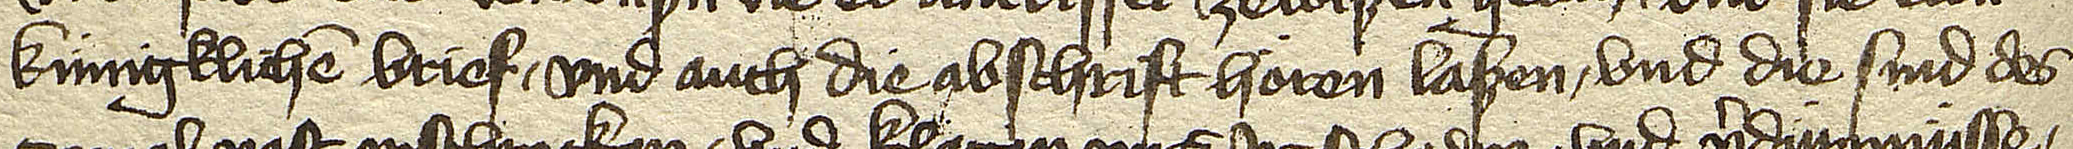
künigkliche* brief / vnd auch die abſchrift hören laſʒen / vnd die ſind des
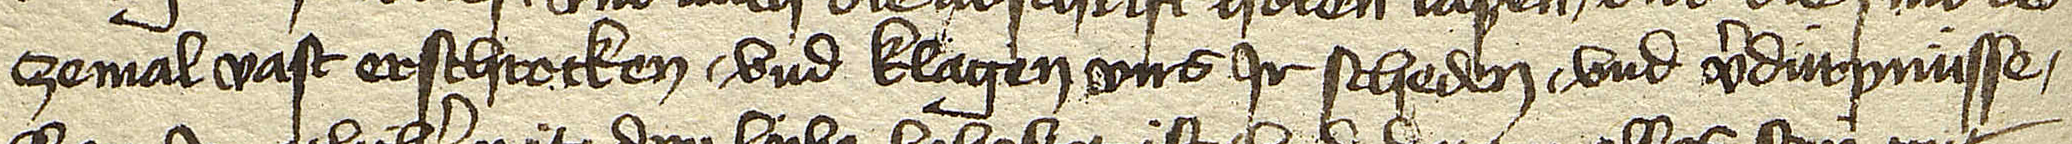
cʒemal vaſt erſchrocken / vnd klagen vns Ir ſcheden / vnd v*dürpnüſſe /
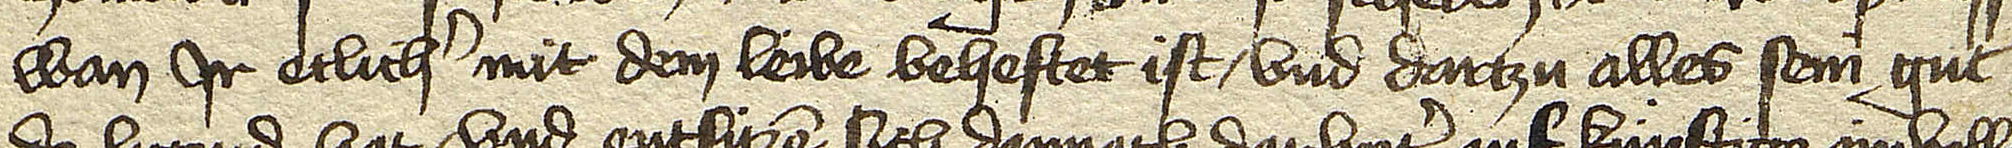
wan Ir etlich* mit dem leibe beheftet iſt / vnd dartʒu alles ſein gut
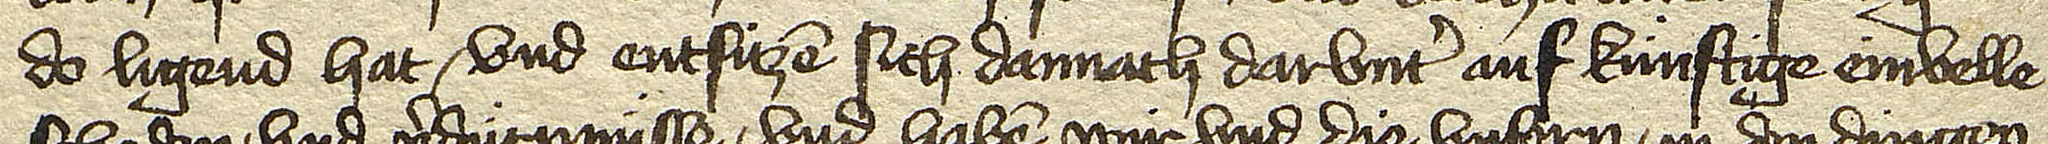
do ligend hat / vnd entſitʒe* ſich dannach darvnt* auf künftige einvelle
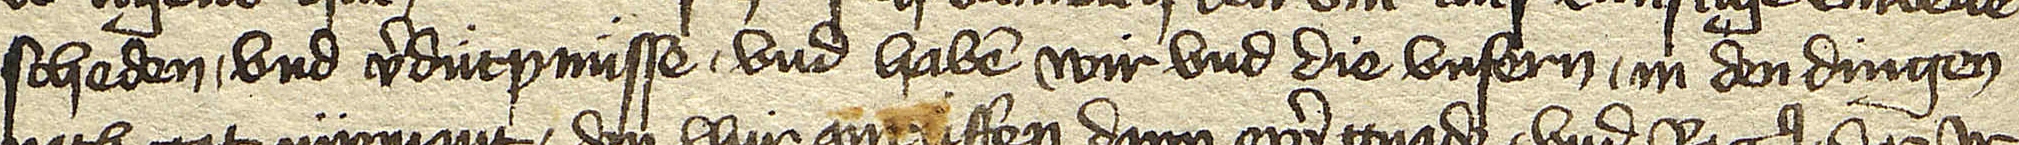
ſcheden / vnd v*dürpnüſſe / vnd habe* wir vnd die vnſern / in den dingen
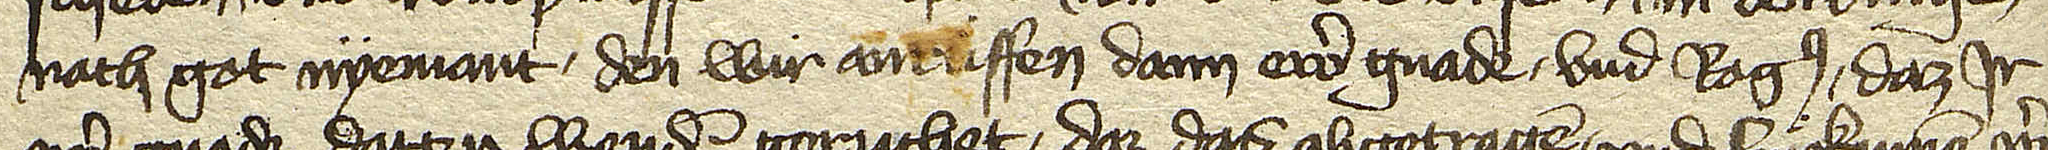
nach got nyemant / den wir anrüffen dann ew* gnade / vnd Ro* / daʒ Ir
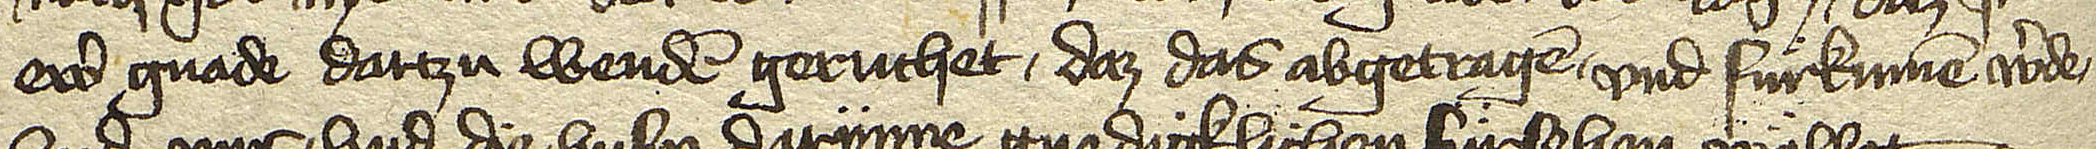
ew* gnade dartʒu wende* geruchet / daʒ das abgetrage* / vnd fürkume* w*de /
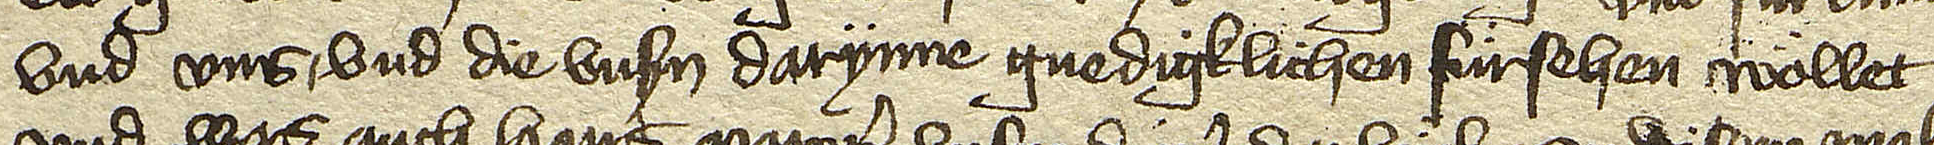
vnd vns / vnd die vnſ*n darynne gnediklichen fürſehen wöllet /
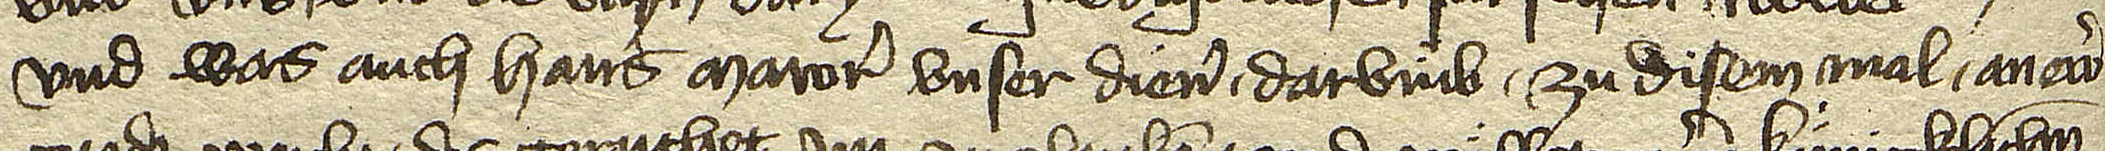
vnd was auch Hans Mawr* vnſer dien* / darvmb / cʒu diſem mal / an ew*
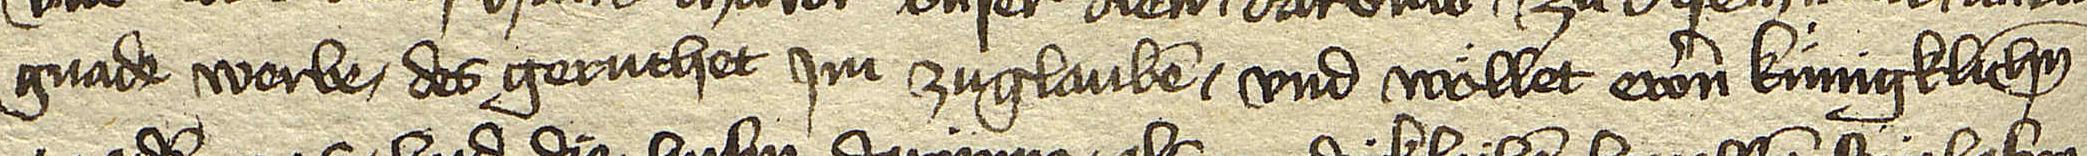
gnade werbe / des geruchet Im cʒuglaube* / vnd wöllet ewn* künigklichn*
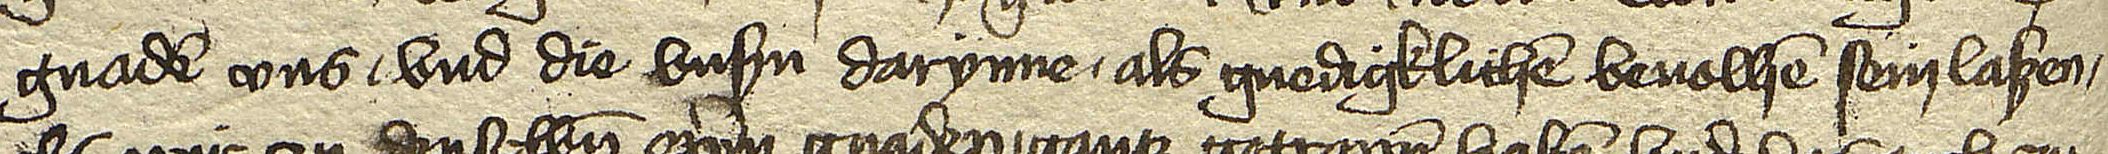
gnade* vns / vnd die vnſ*n darynne / als gnedigkliche* beuolhe* ſein laſʒen /
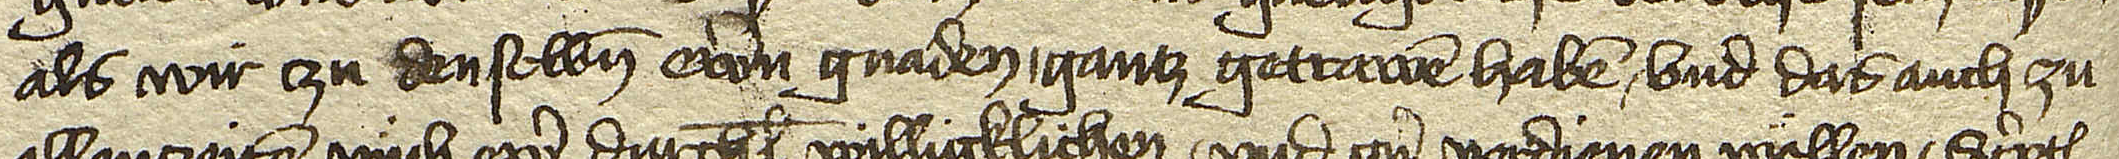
als wir cʒu denſelbn* ewn* gnaden / gantʒ getrawe* habe* / vnd das auch cʒu
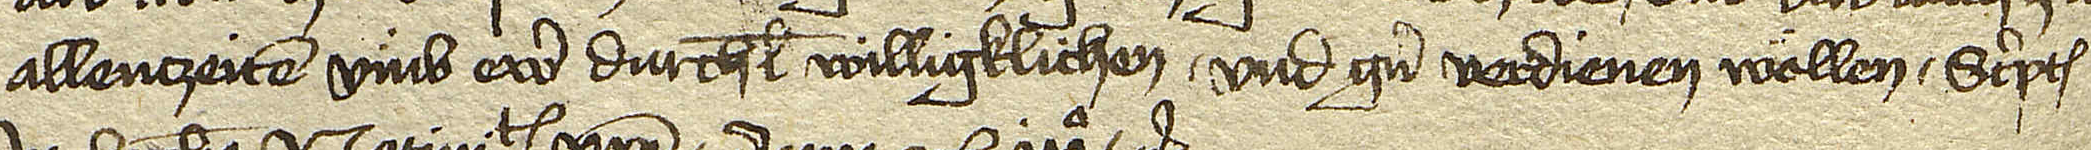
allencʒeite* vmb ew* durchl* willigklichen / vnd gn* verdienen wöllen / Sc*pt*
